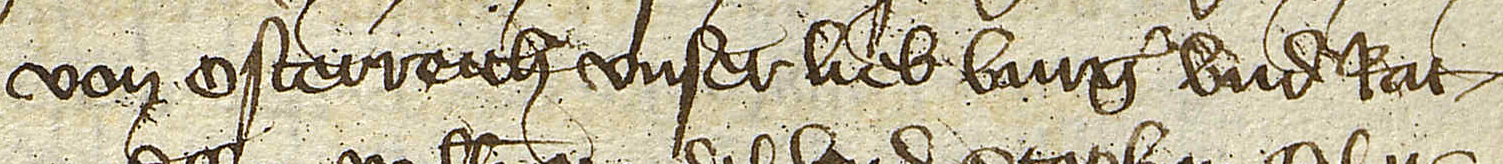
von Oſterreich vnſer lieb burg* vnd Rat
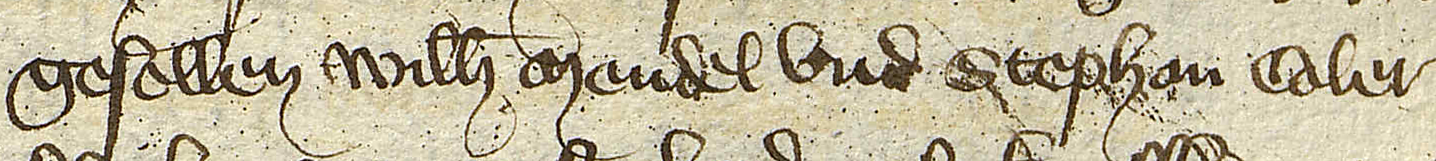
geſellen wilh* Mendel vnd Stephan Coler
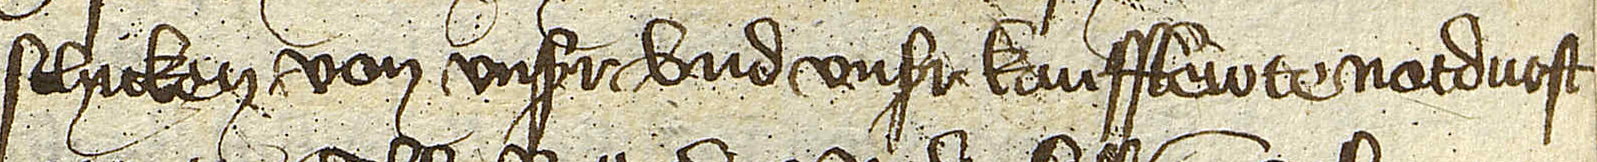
ſchicken von vnſ*r / vnd vnſ*r kaufflewte notdurft
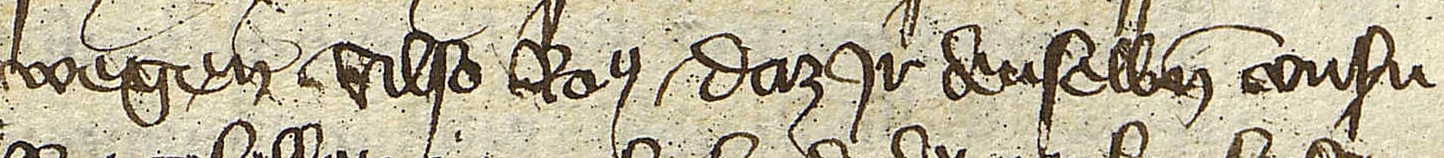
wegen / Alſo Ro* / daʒ Ir denſelbn* vnſ*n
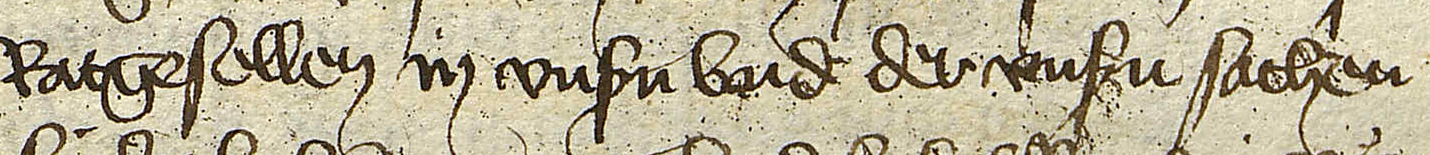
Ratgeſellen in vnſ*n vnd der vnſ*n ſachen
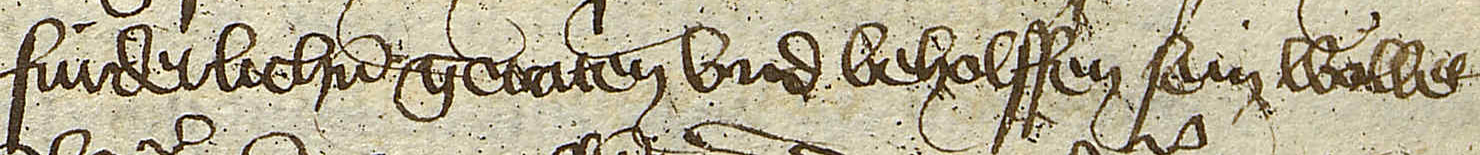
fürderlichn* geraten vnd beholffen ſein wöllet
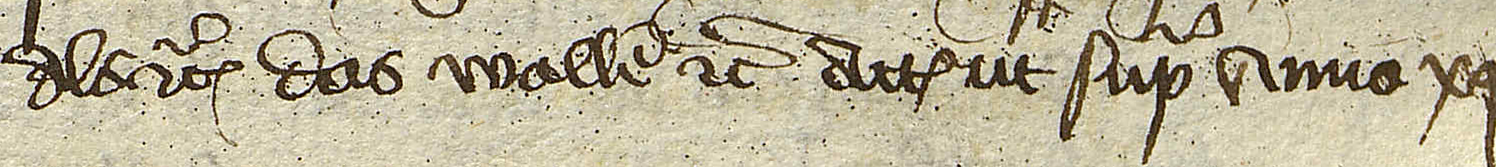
Als ec* das wolle* ec* Act* ut ſup* Anno xi*
